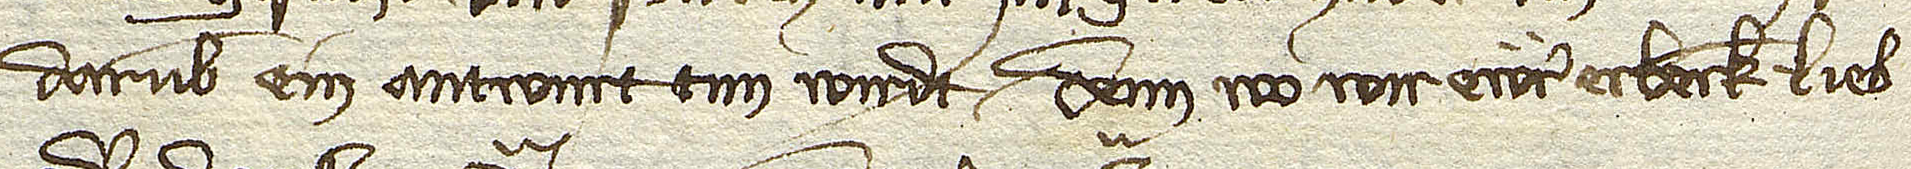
daru*b ein antwurt tun wirdt / Denn wo wir ew*r erberk* lieb
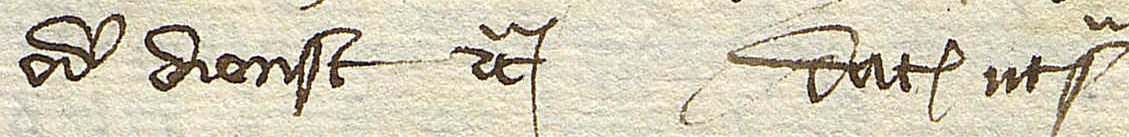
od* dienſt ec* Dat* ut ſ*
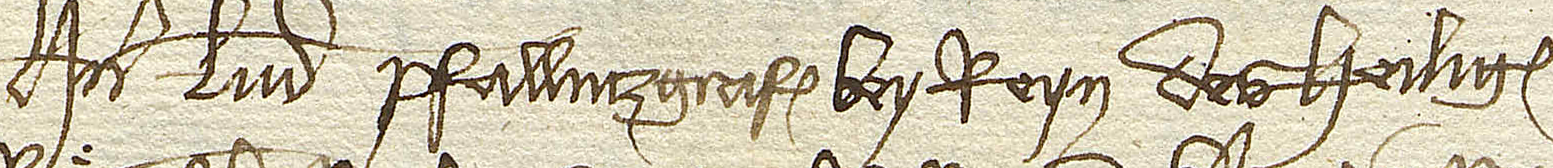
H*n Lud* Pfallncʒgraf* bey Reyn Des Heilig*
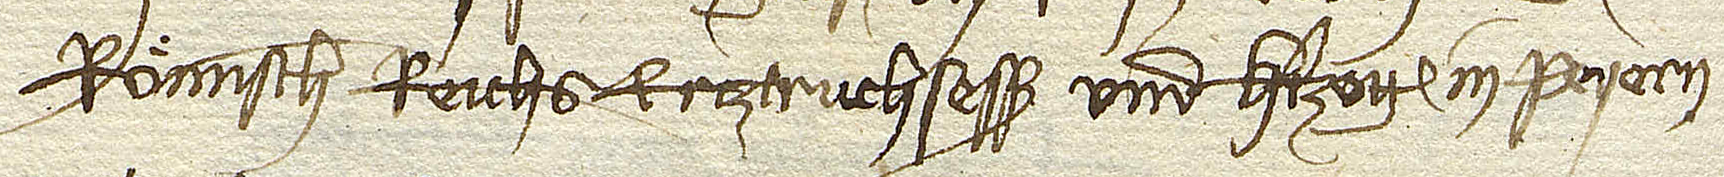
Römiſch* Reichs Ercʒtruchſeſſ* vnd h*cʒog* in Peyern
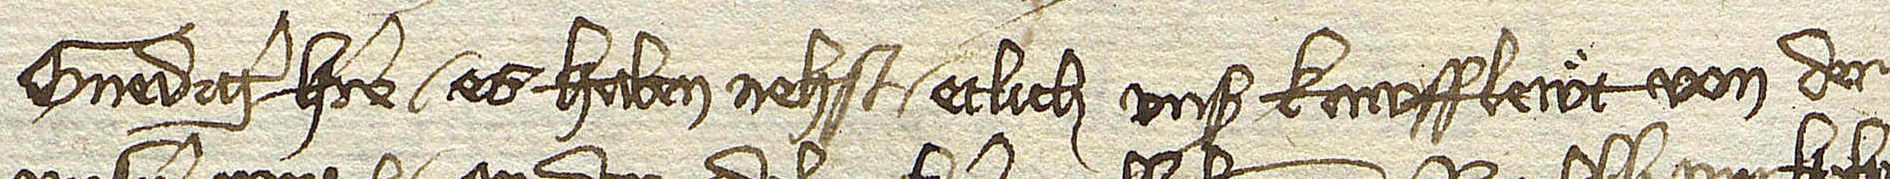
Gnedig* h*re / es haben nehſt / etlich vnſ* kawfflewt von der
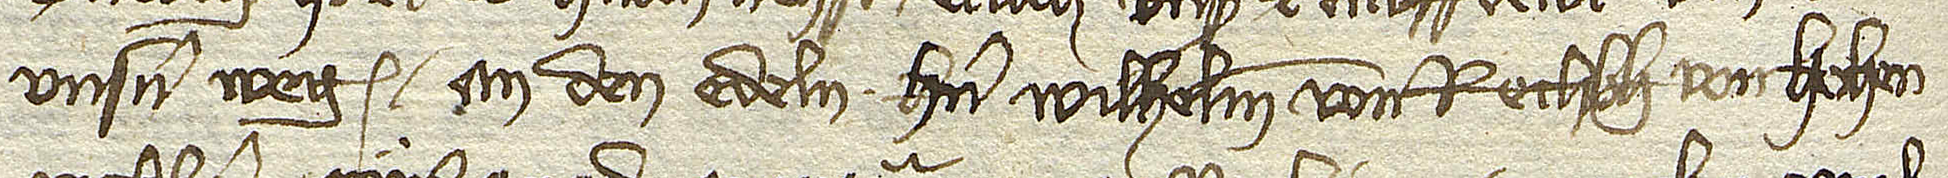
vnſ*n weg* / an den edeln . h*n wilhelm* von Rechb*g von hohen
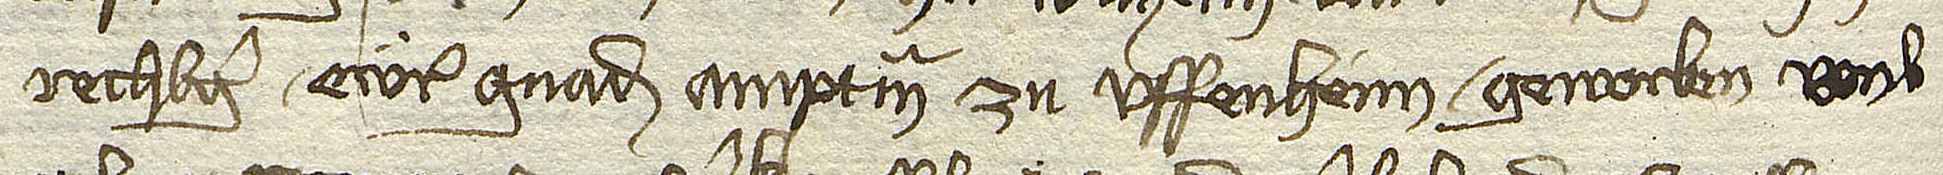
rechb*g / ew*r gnad* amptm* ʒu vffenheim / geworben vmb
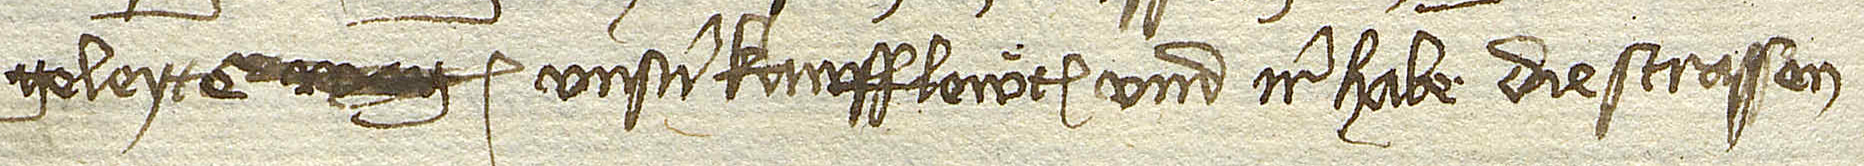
geleyte weg* vnſ*n kawfflewt* vnd ir* habe . die ſtraſſen
